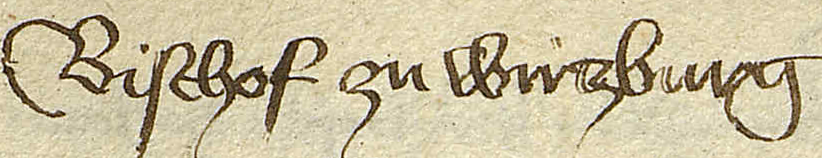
Biſchof cʒu wircʒburg
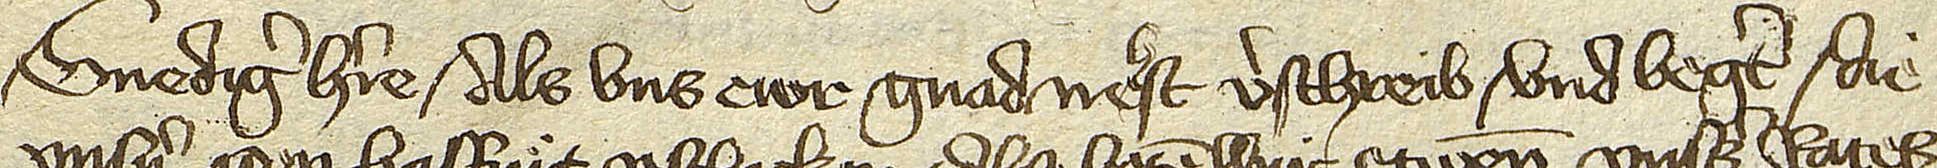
Gnedig* h*re / Als vns ewr gnad neſt v*ſchreib / vnd begt* / die
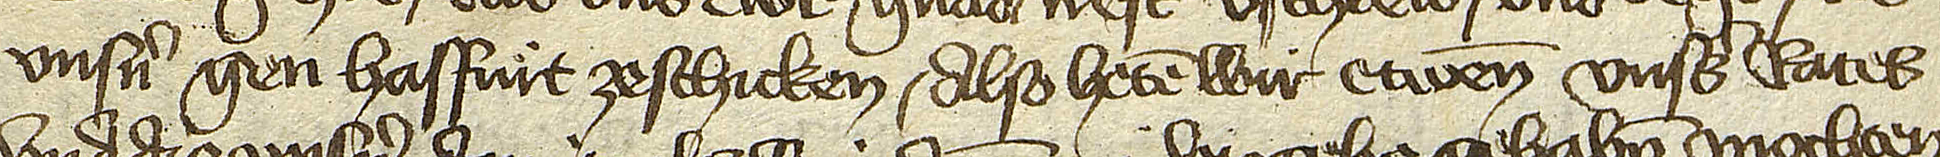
vnſn* gen haſfürt cʒeſchicken / Alſo hete* wir etwen* vnſs* Rates
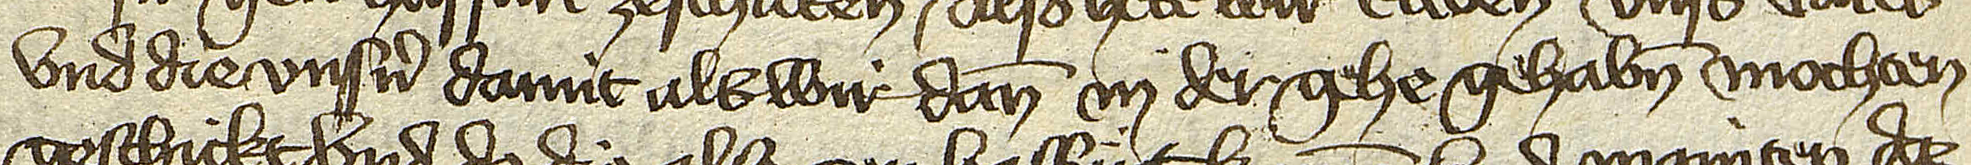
vnd die vnſn* damit als wir dan* in der gehe gehabn* mochten
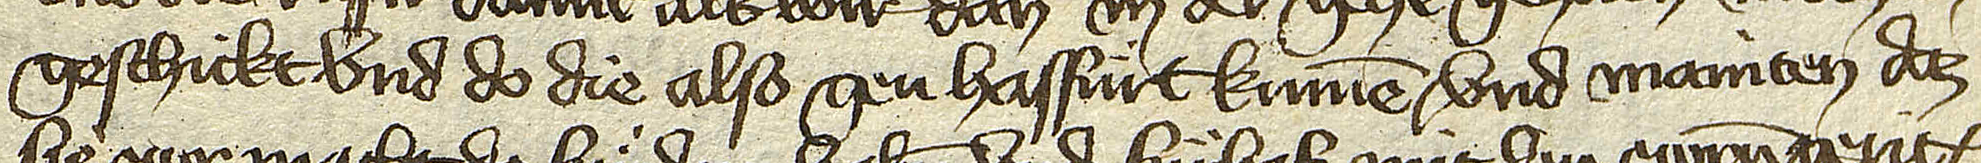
geſchickt vnd do die alſo gen haſfürt kume* / vnd mainten daʒ
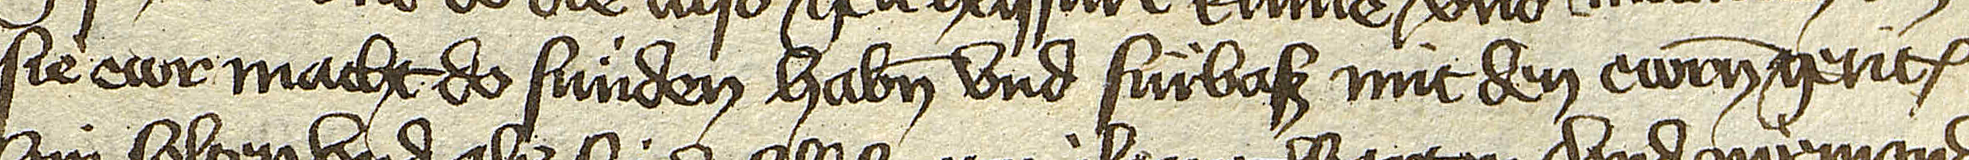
ſie ewr macht do fünden habn* vnd fürbaſʒ mit den ewrn* gerit*
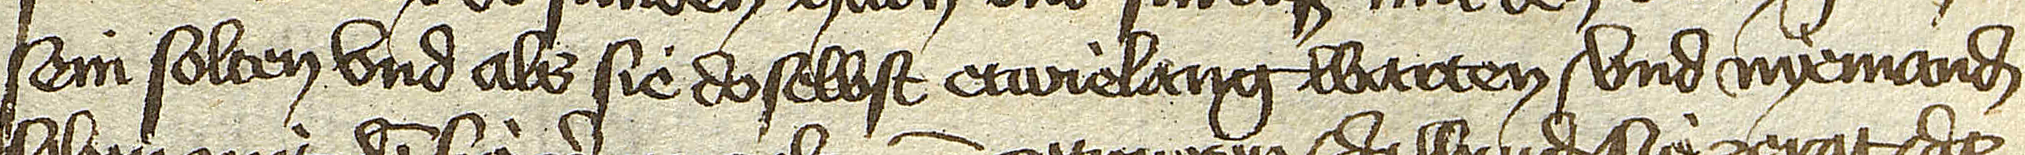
ſein ſolten vnd als ſie doſelbſt etwielanf warten / vnd nyemand*
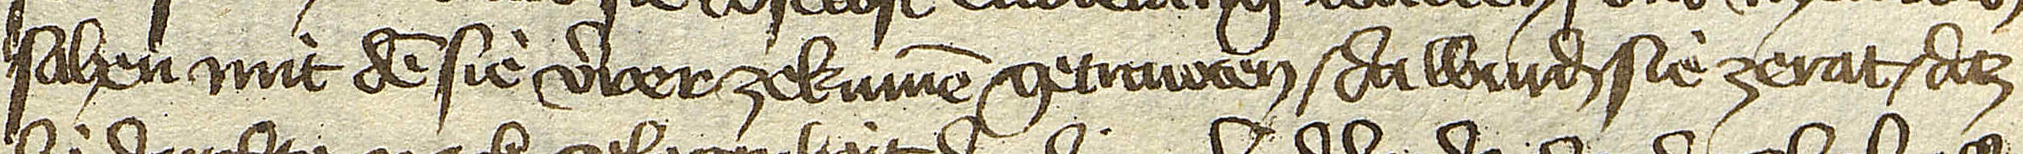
ſolten mit de* ſie v*rer cʒekume* getrawen / da wurd* ſie ʒerat / daʒ
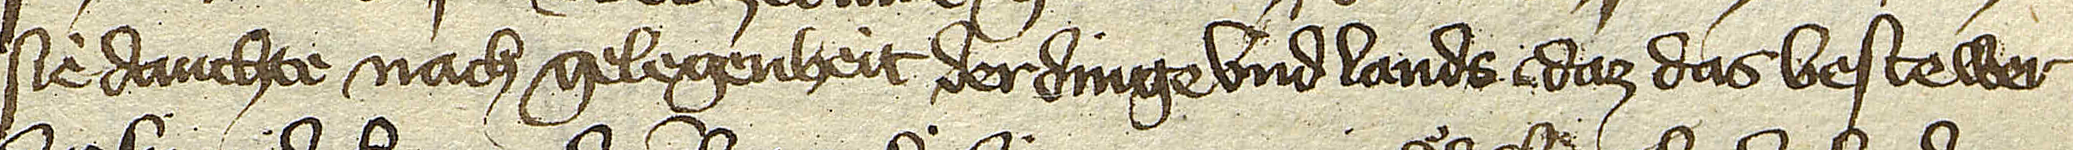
ſie dauchte nach gelegenheit der dinge vnd lands / daʒ das beſte wer
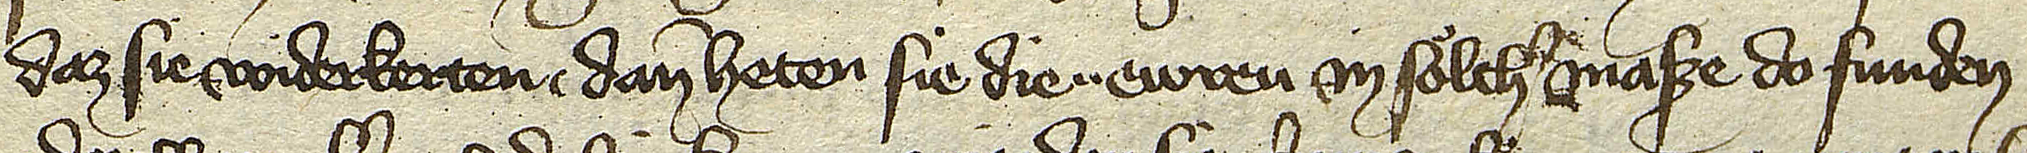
daʒ ſie widerkerten / dan* heten ſie die ~ ewren in ſölich maſʒe do funden
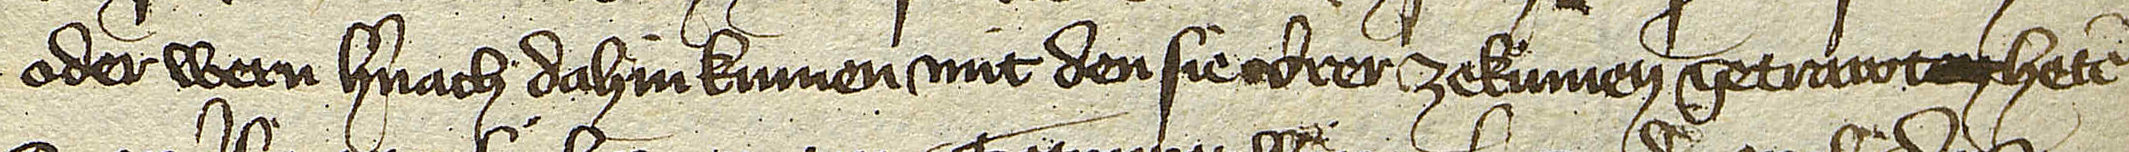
oder wern h*nach dahin kumen mit den ſie v*rer cʒekümen getrawten hete*
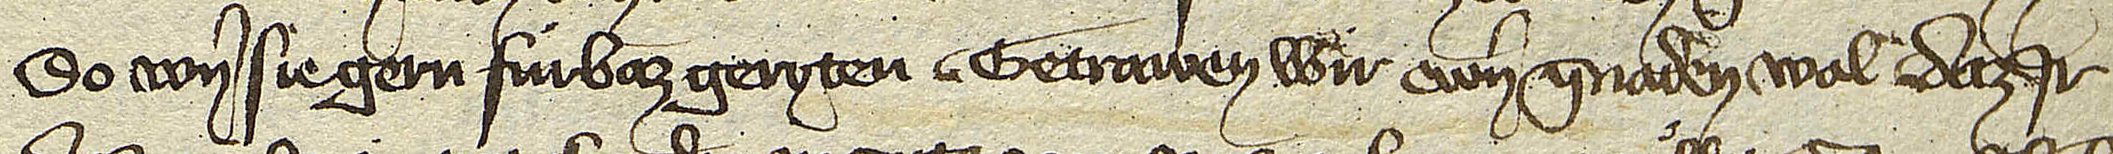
So wn* ſie gern fürbaʒ geryten / Getrawen wir ewn* gnaden wol / daʒ Ir
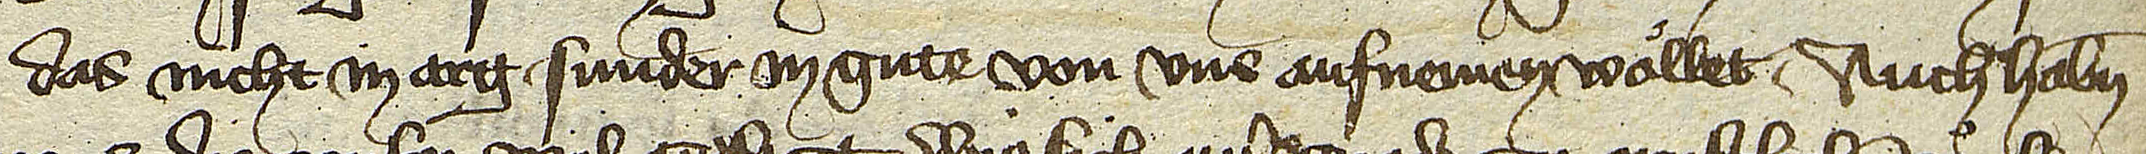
das nicht in arg / ſunder in gute von vns aufnemen wöllet / Auch habn*
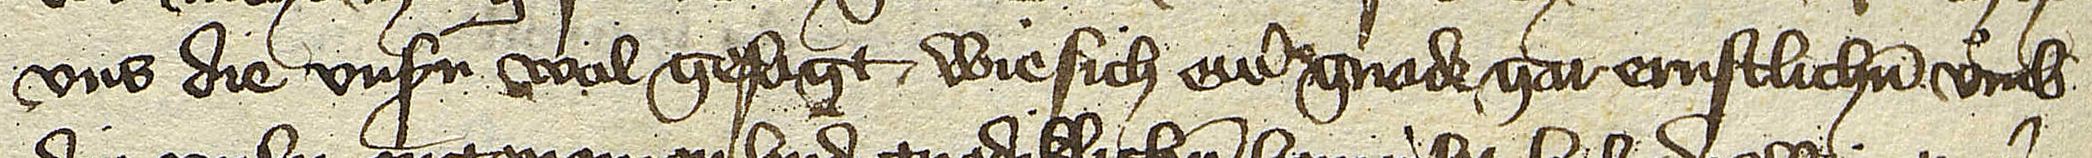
vns die vnſ*n wol geſagt / wie ſich ew* gnade gar ernſtlichn* v̈mb
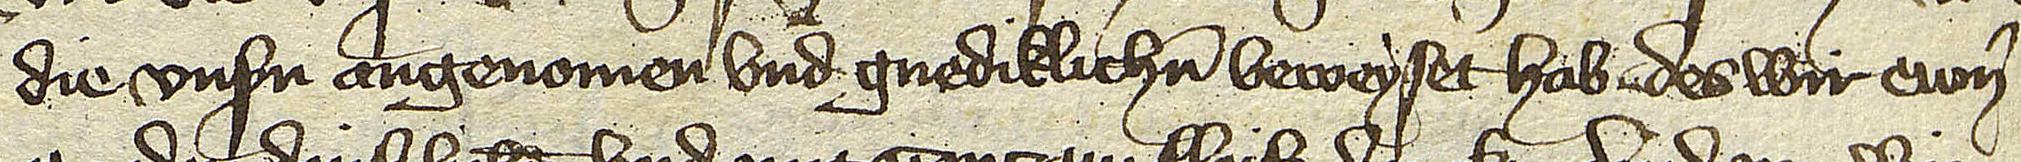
die vnſ*n angenomen vnd gnedikllichn* beweyſet hab / des wir ewn*
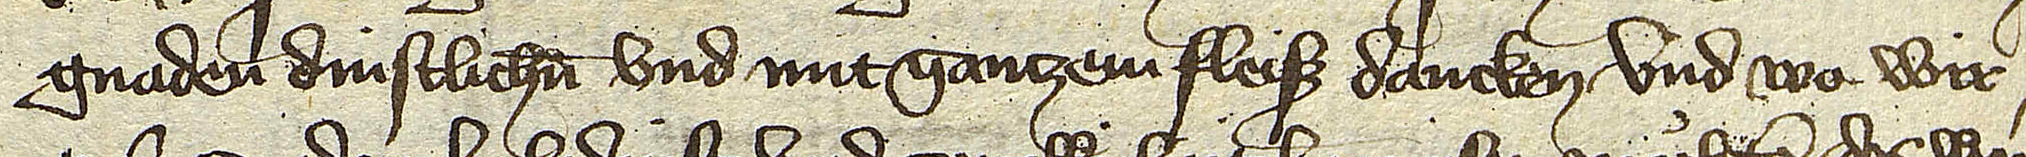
gnaden dinſtlichn* vnd mit gancʒem fleiſʒ dancken / vnd wo wir
